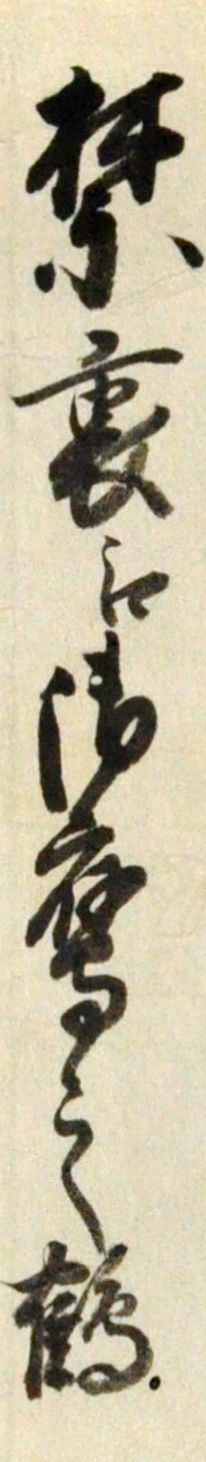禁裏江御鷹之鶴
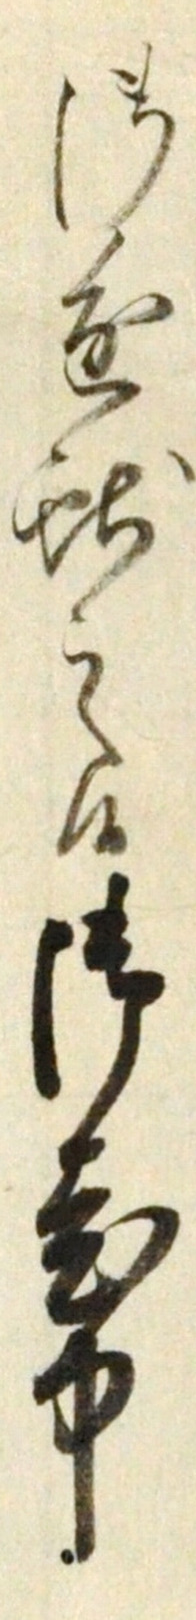御進献之候、御老中
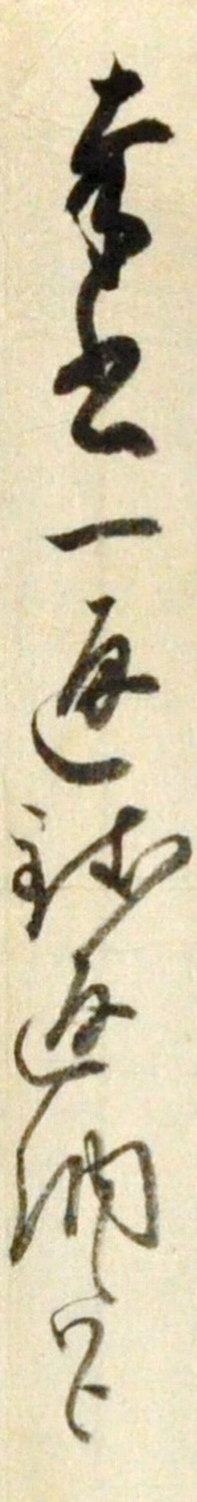奉書一通致返納候、以上
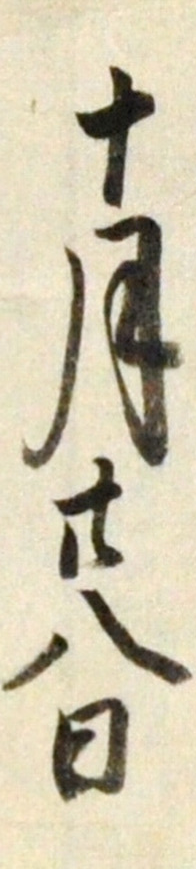十月廿八日
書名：覚
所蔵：伊那市立高遠町図書館・合同会社AMANE
